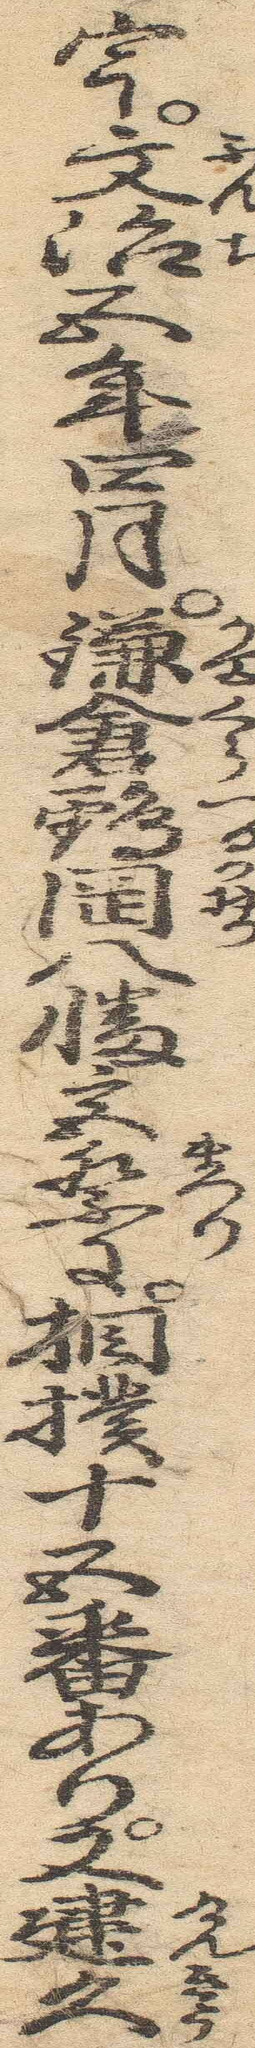宇。文治五年四月。鎌倉鶴岡八幡宮祭に。相撲十五番あり。又建久
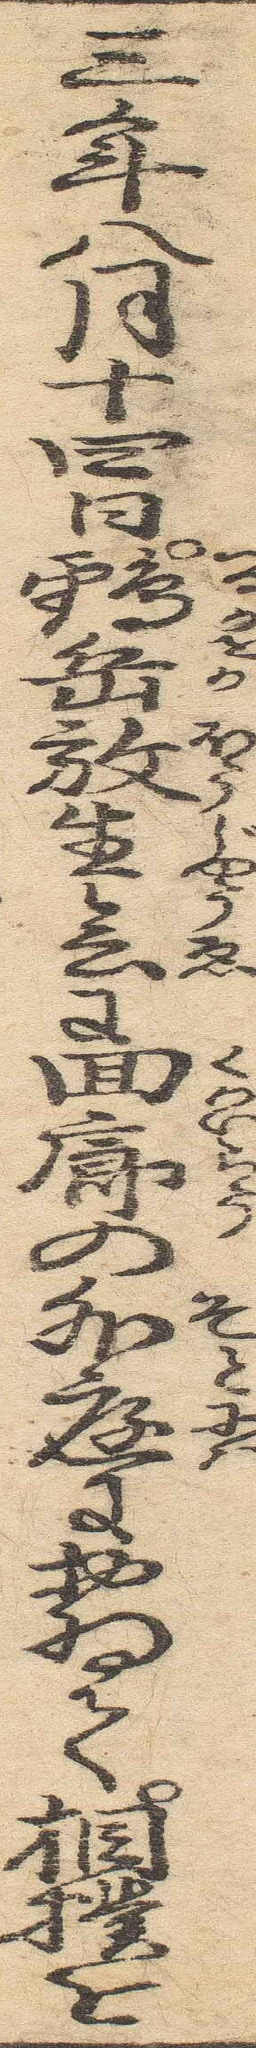三年八月十四日。鶴岳放生会に回廊の外庭におゐて。相撲を
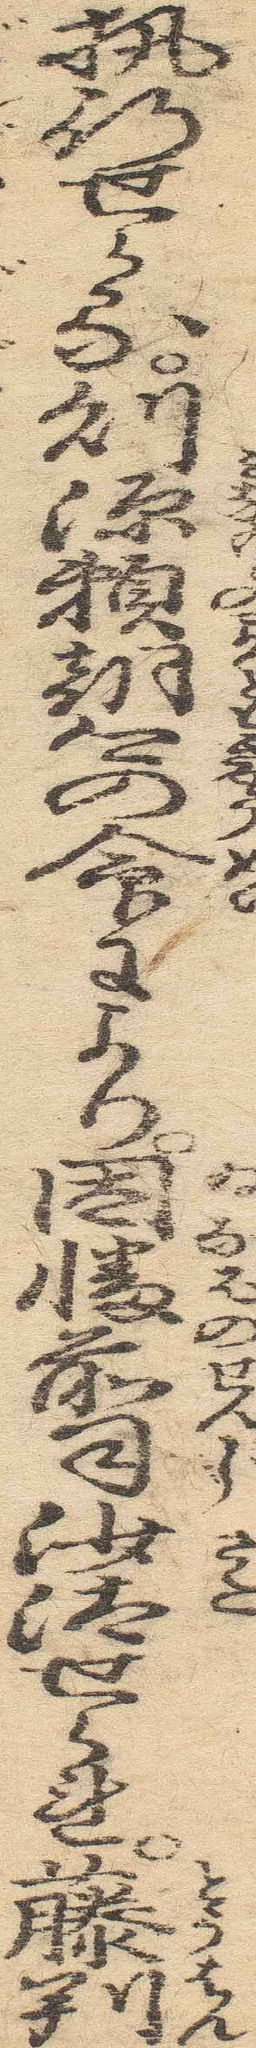執行せらる。則源頼朝卿の命により。因幡前司沙汰せられ。藤判
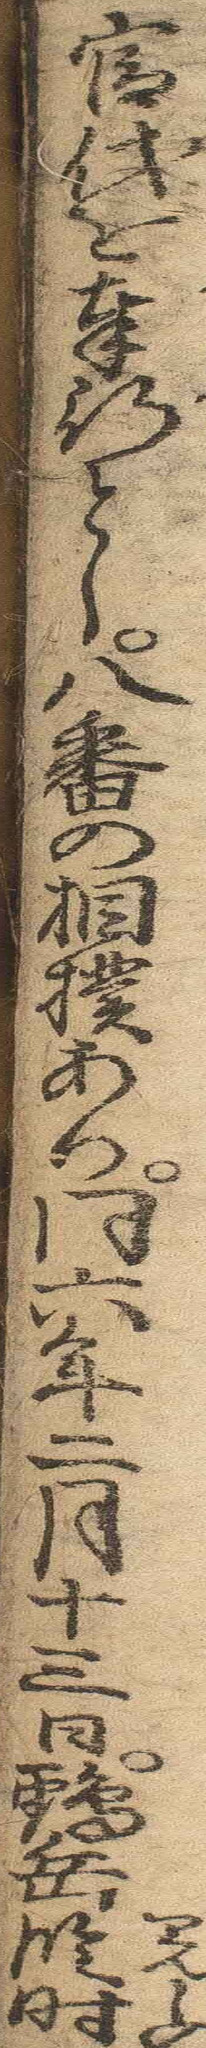官代を奉行とし。八番の相撲あり。同六年二月十三日。鶴岳臨時
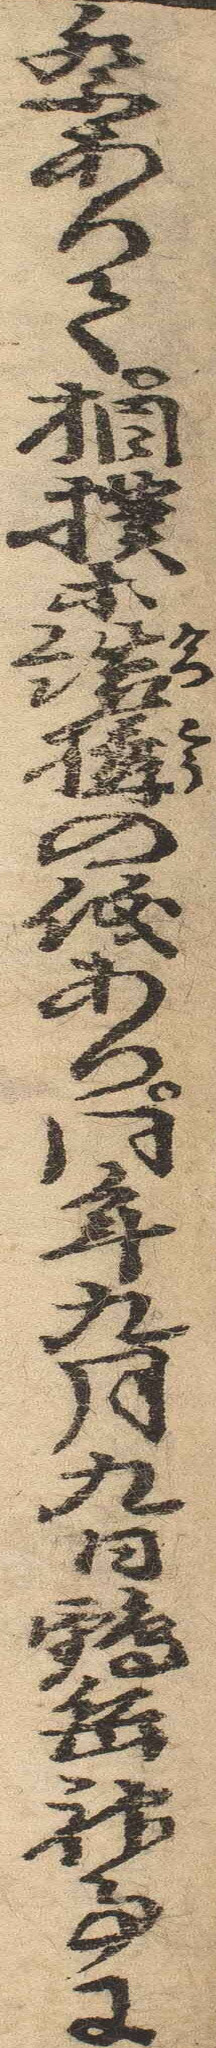祭ありて。相撲等結構の儀あり。同年九月九日鶴岳神事に
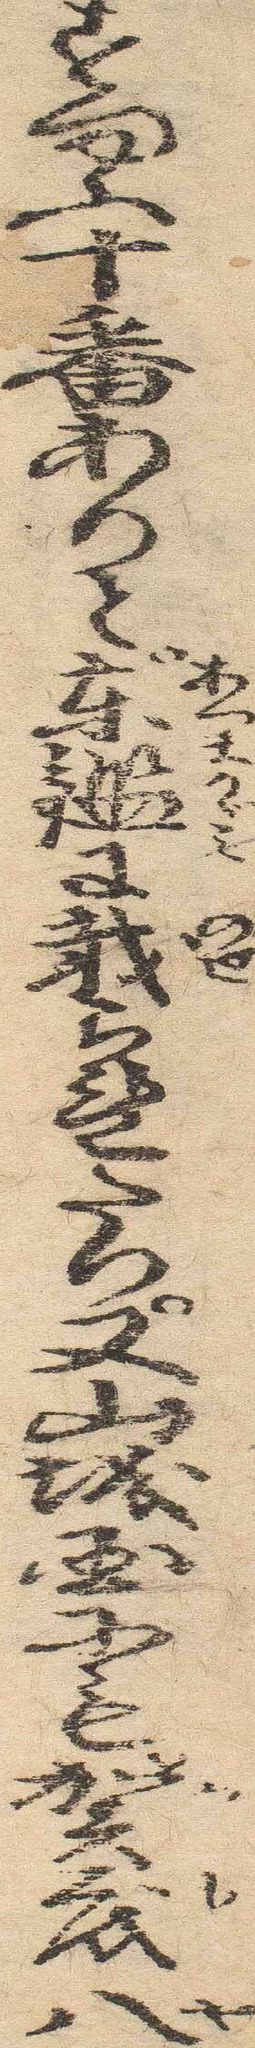すまふ十番ありと。東鑑に載られたり。又山城国にも。賀茂八
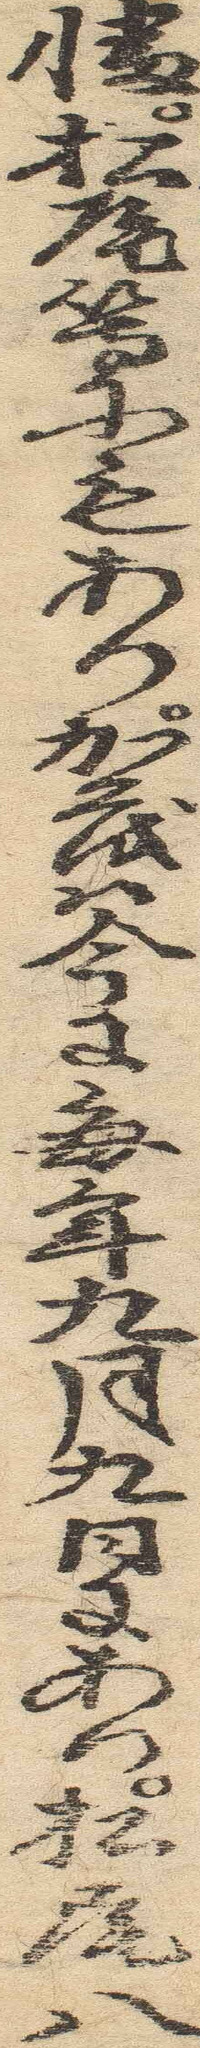幡。松尾等にもあり。賀茂は今に毎年九月九日にあり。松尾八
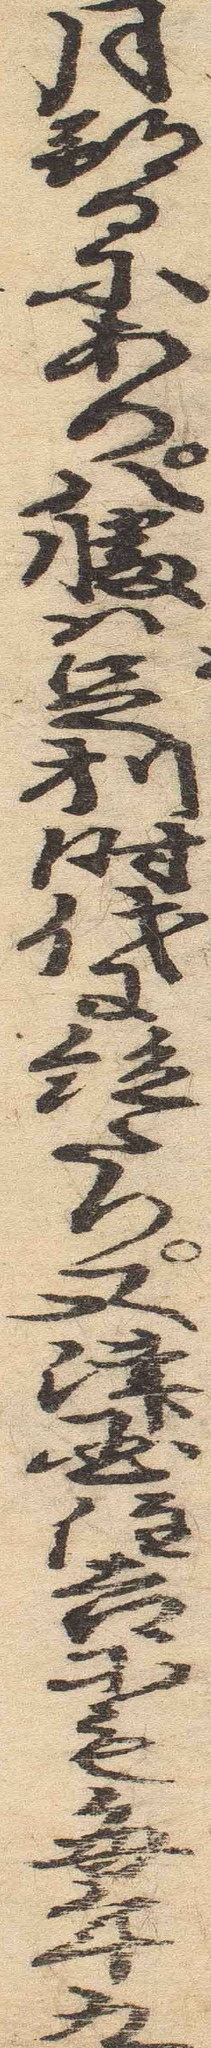月朔日にあり。八幡は足利時代に絶たり。又隣国住吉にも毎年九
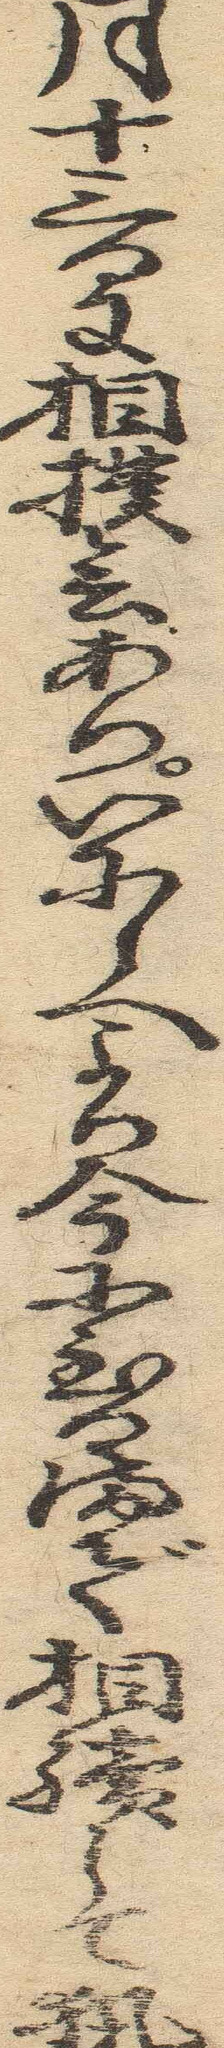月十三日に相撲と云あり。いにしへより今に至るまで相続して執
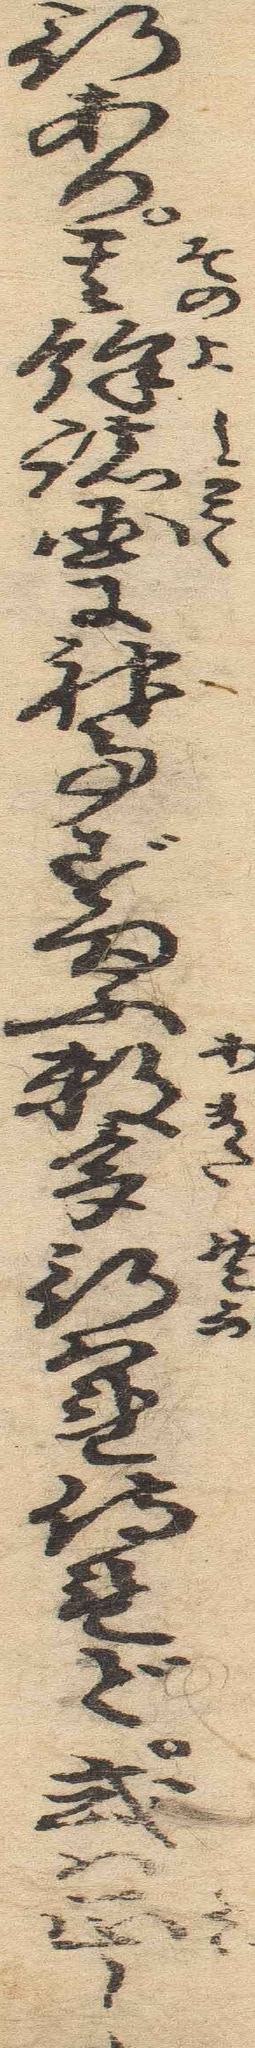行あり。其餘諸国に神事ずまふ数多行はれ侍れど。式は正し
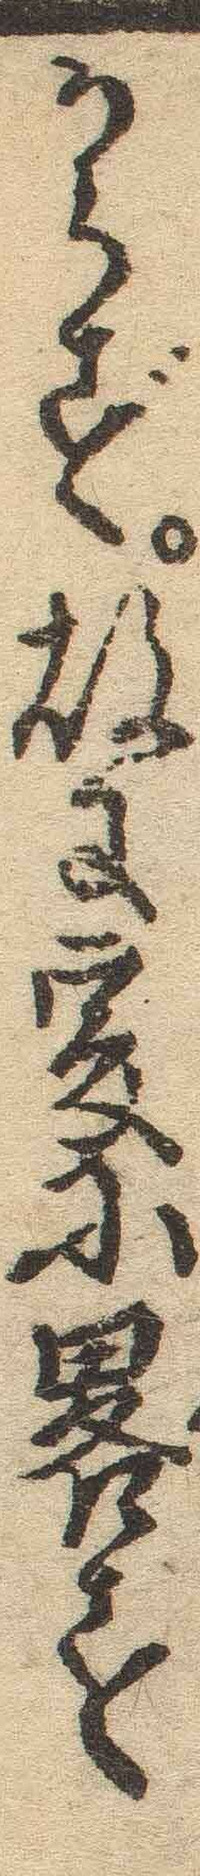からず。故に爰に畧す
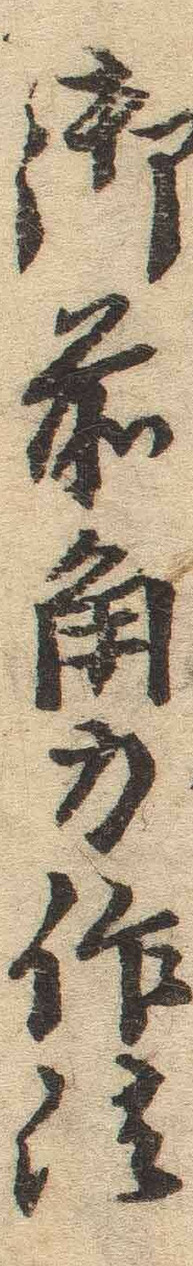御前角力作法
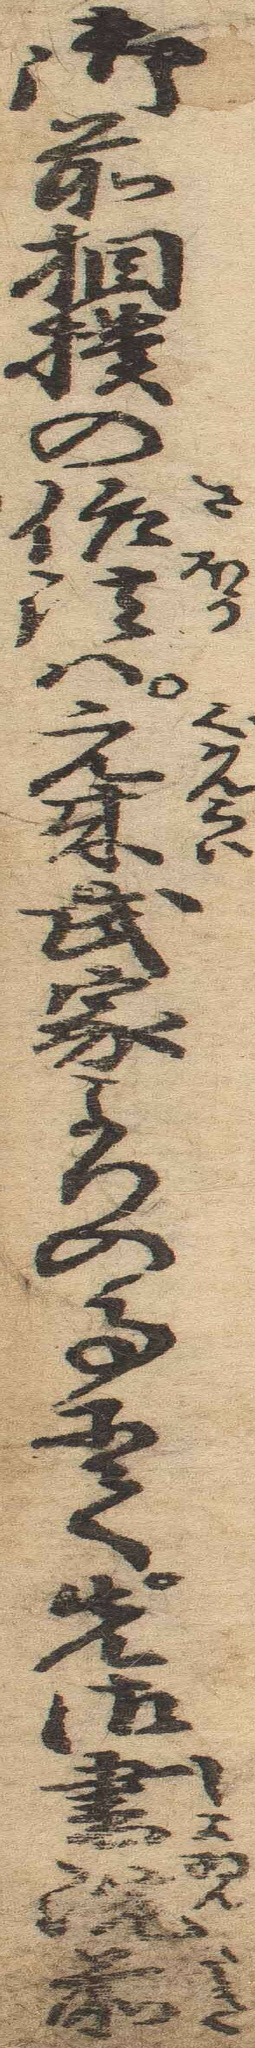御前相撲の作法は。元来武家よりの事にて。先御書院前

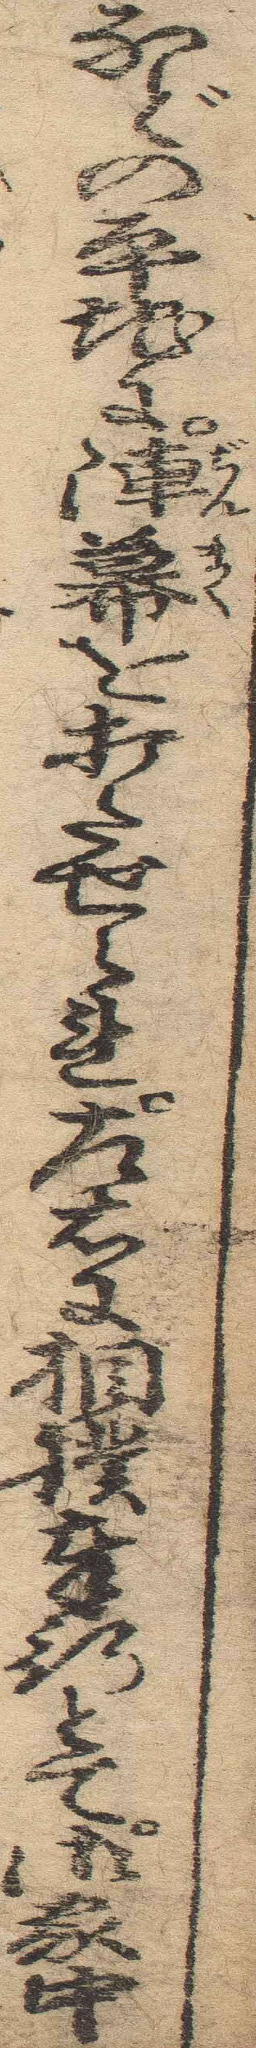などの平地に。陣幕を打たせられ。左右に相撲奉行とて。御家中
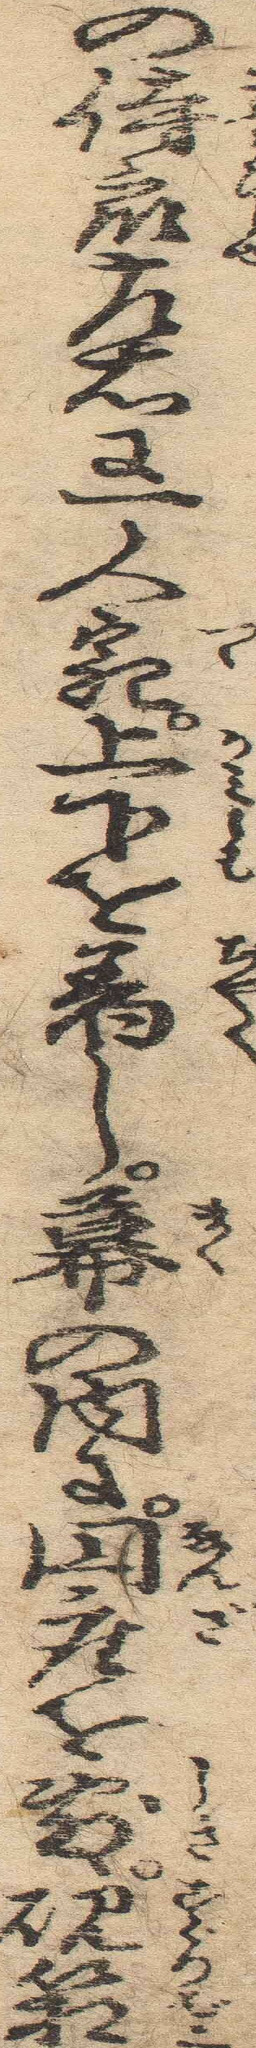の侍衆左右に一人宛。上下を着し。幕の内に。円座を敷。硯箱
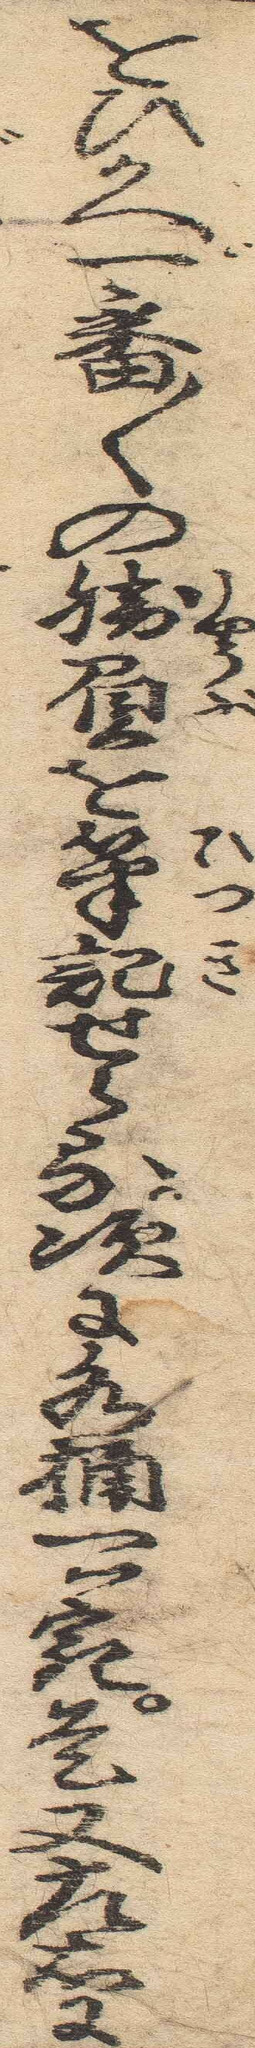をひかへ。一番〳〵の勝負を筆記せらる。次に水桶一つ宛。是又左右に
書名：古今相撲大全
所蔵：東京学芸大学附属図書館 国文学研究資料館
